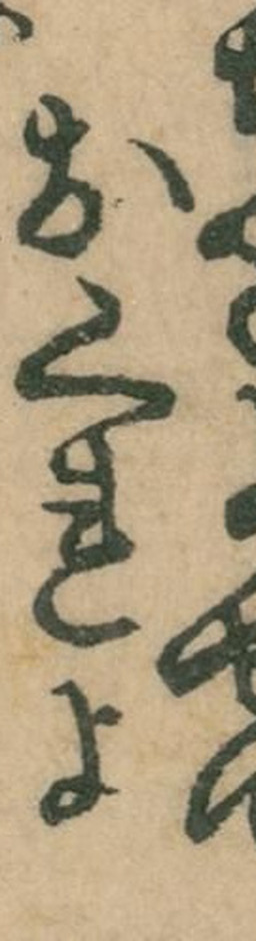おくれよ
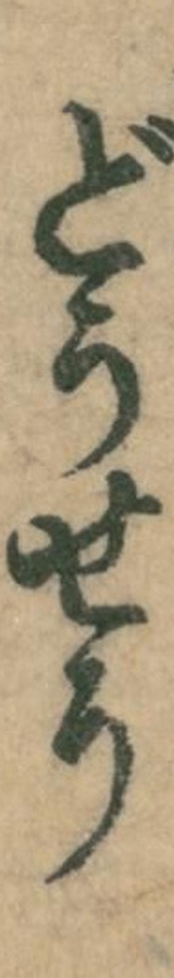どうせう
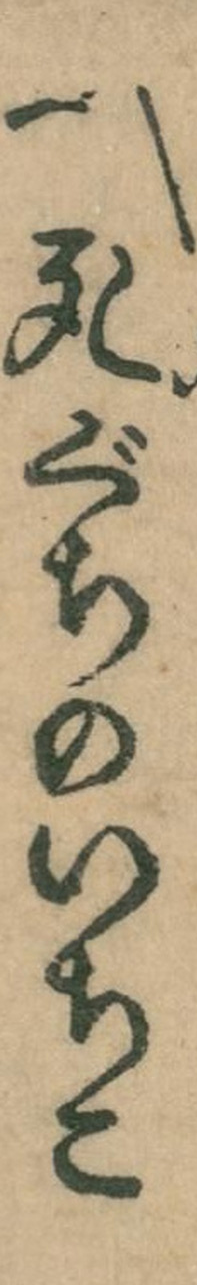〽死ぐちのいちこ
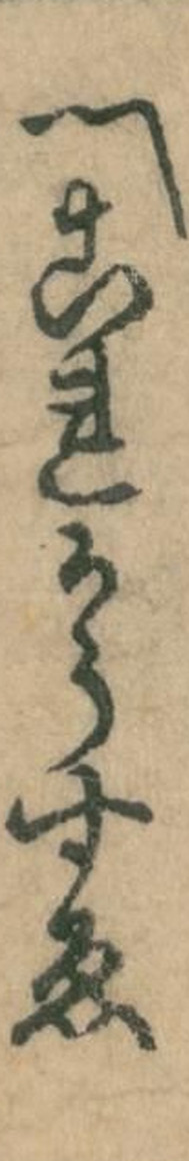〽これからすゑ
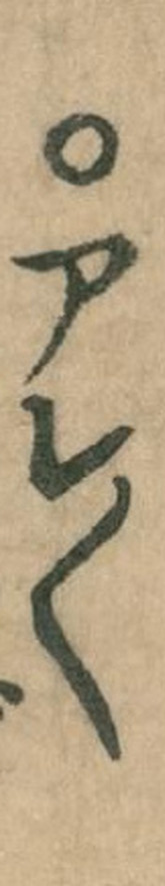◯アレ〳〵
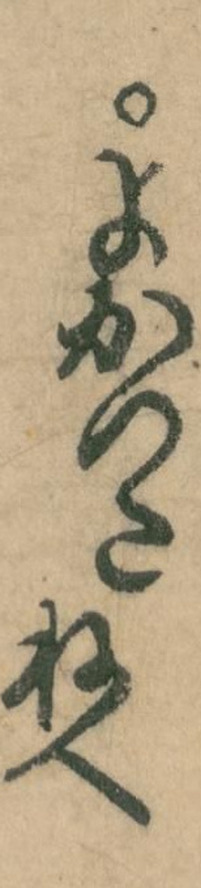◯よかつたねへ
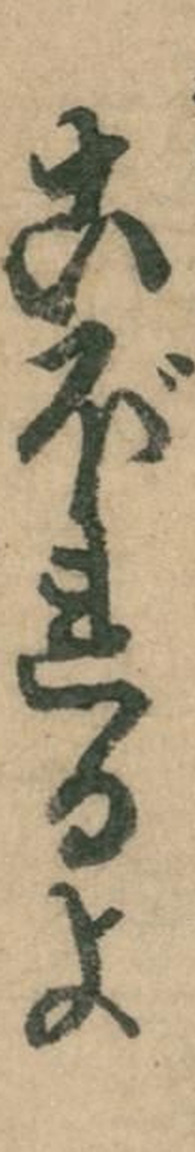こぼれるよ
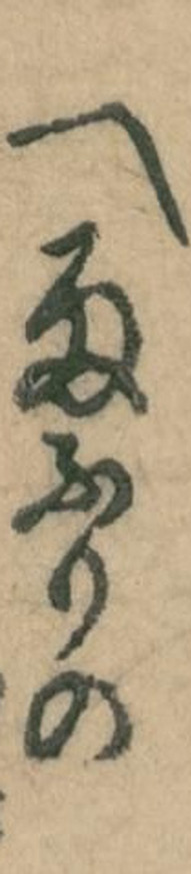〽雨ふりの
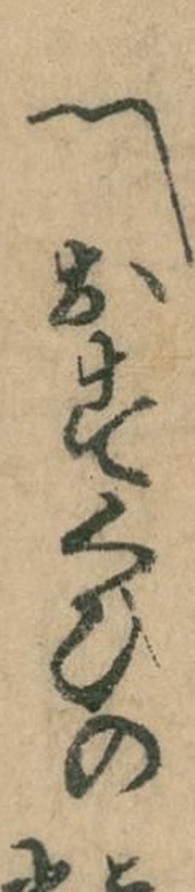〽おすくひの
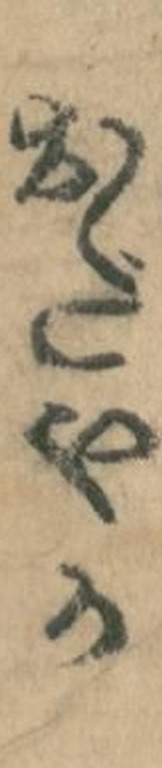おだやか
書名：地震出火　再度目のお笑ひ
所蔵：東京大学地震研究所図書室 Earthquake Research Institute Library, The University of Tokyo, JAPAN
